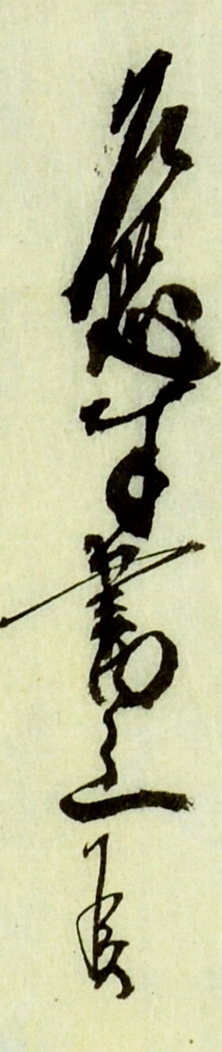乍恐奉書上申候
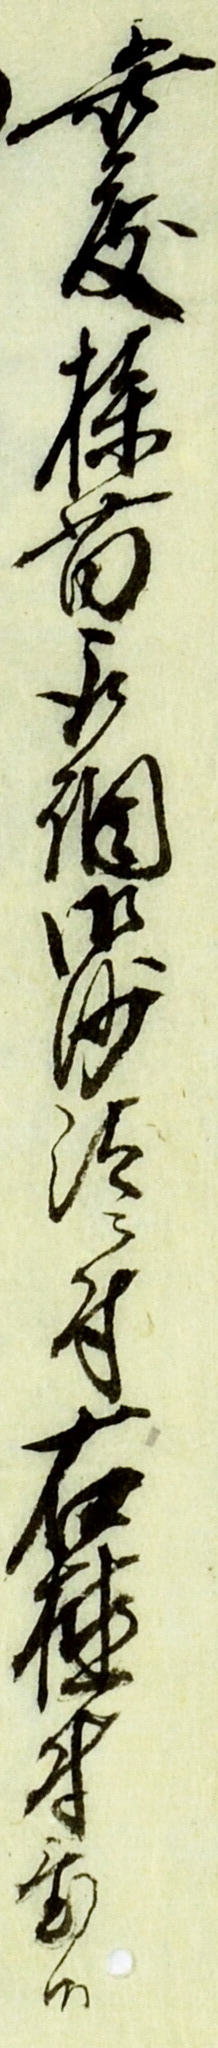此度株苗取調御沙汰ニ付右植付置候
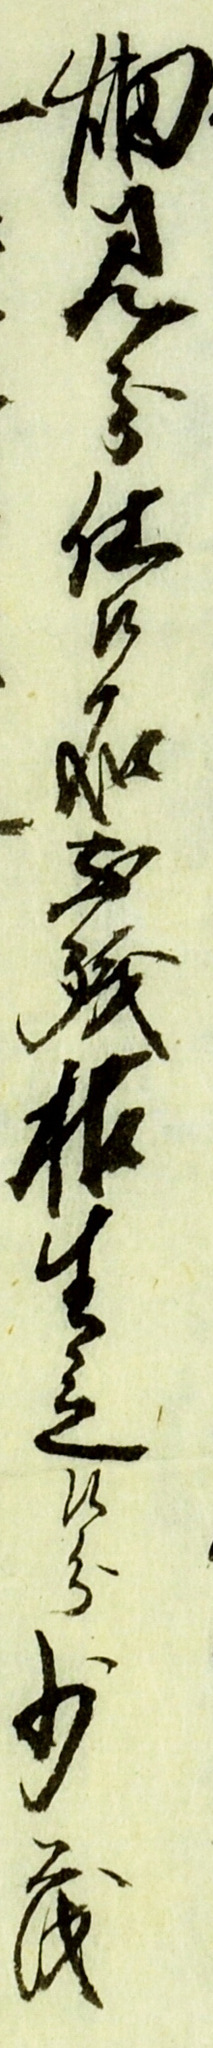畑見分仕候処不残枯生立地候分少茂
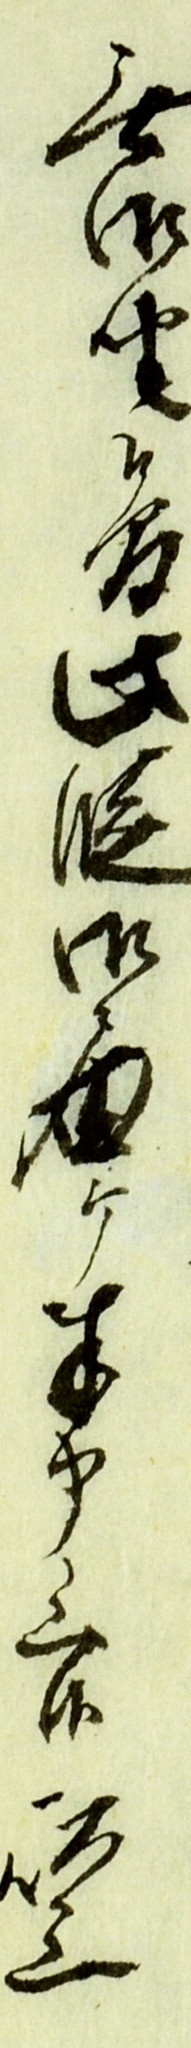無御座候間此段御届ケ奉申上候以上
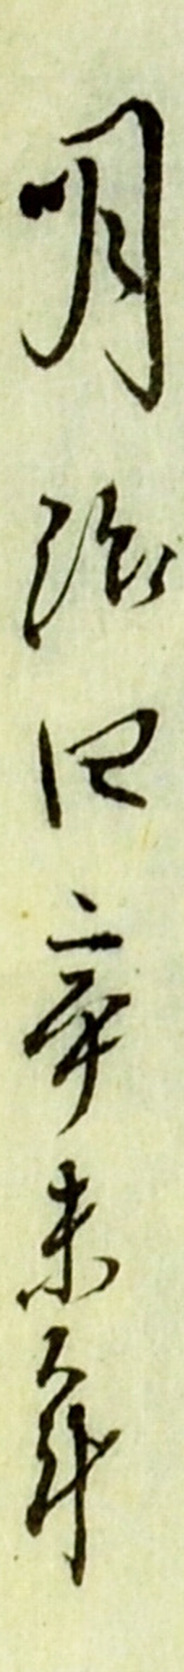明治四辛未年
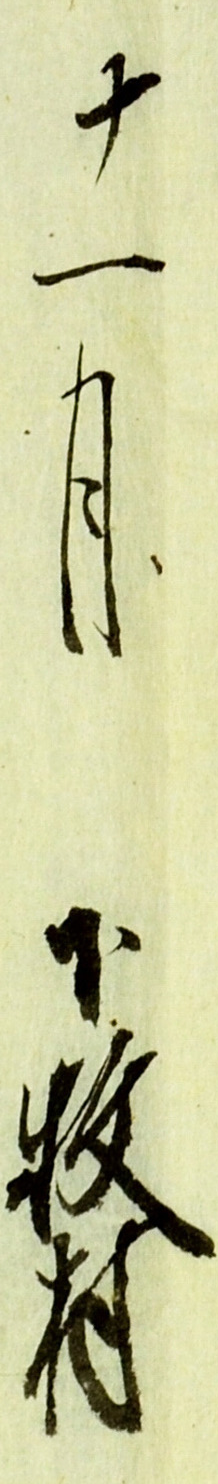十一月下牧村
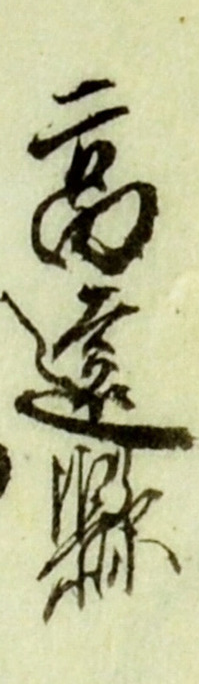高遠県
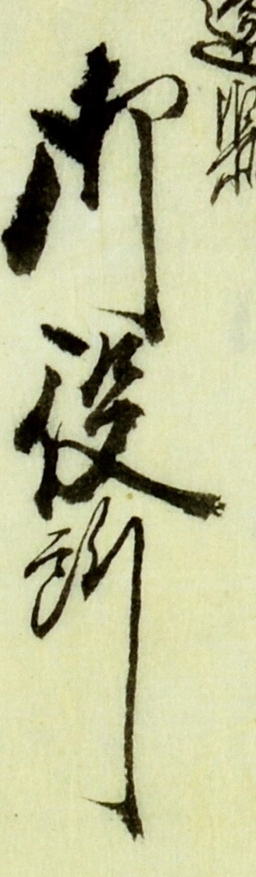御役所

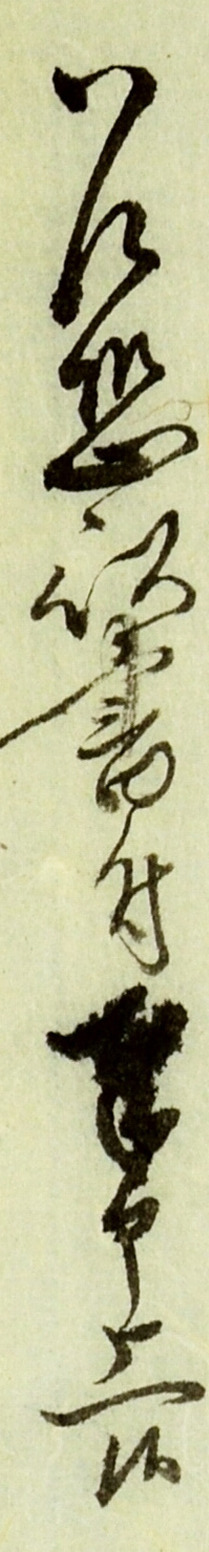乍恐以書付奉り申上候
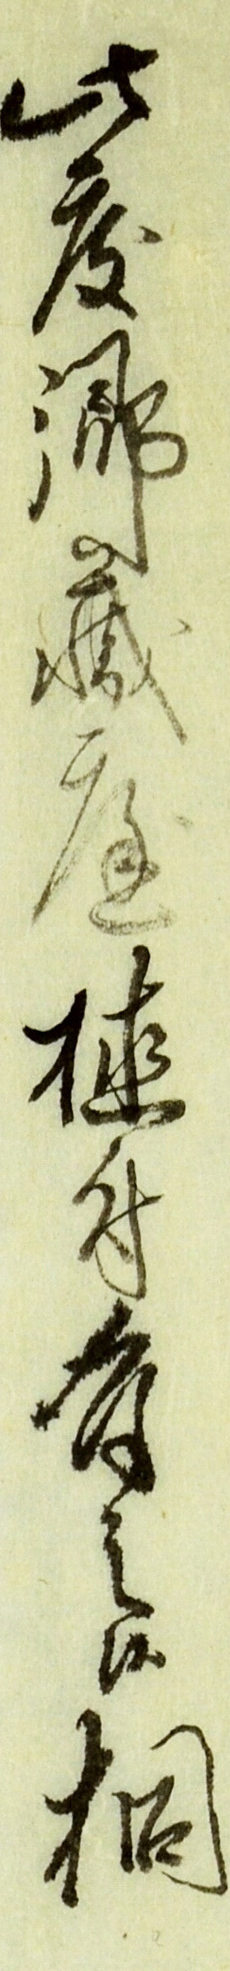此度郷蔵庭植付有之候桐
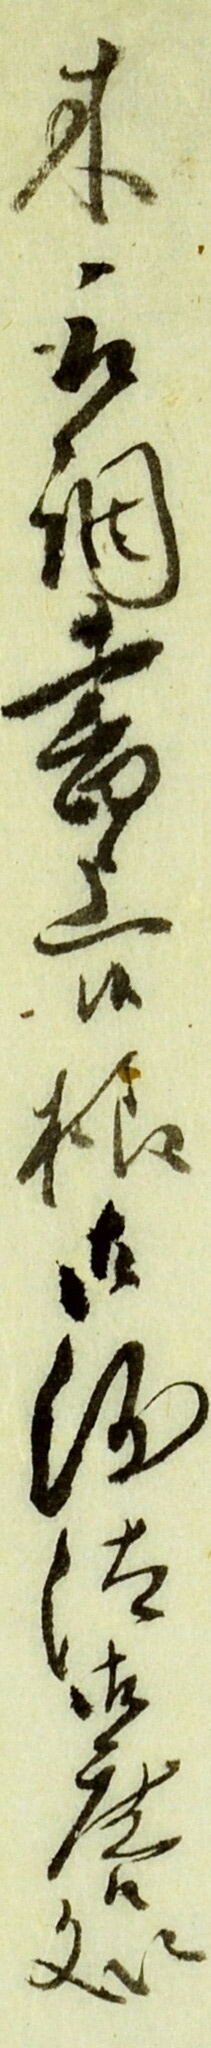木取調書上候様御沙汰御座候処
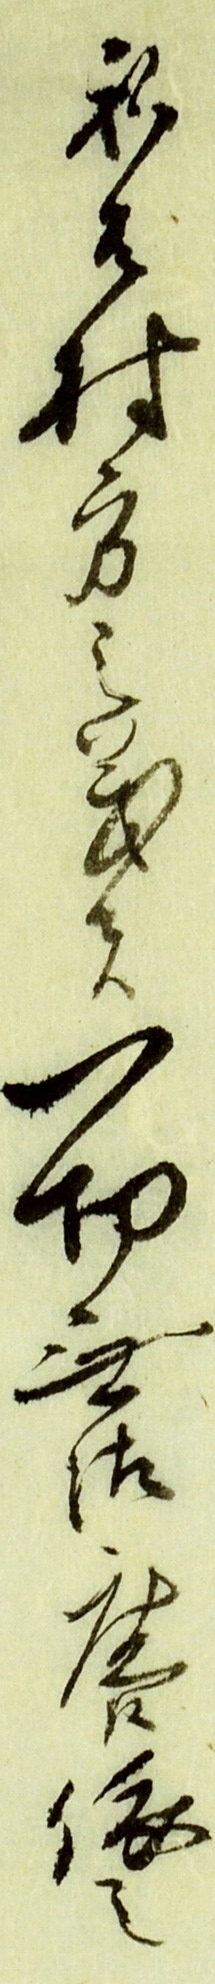私共村方之義者一切無御座候依之
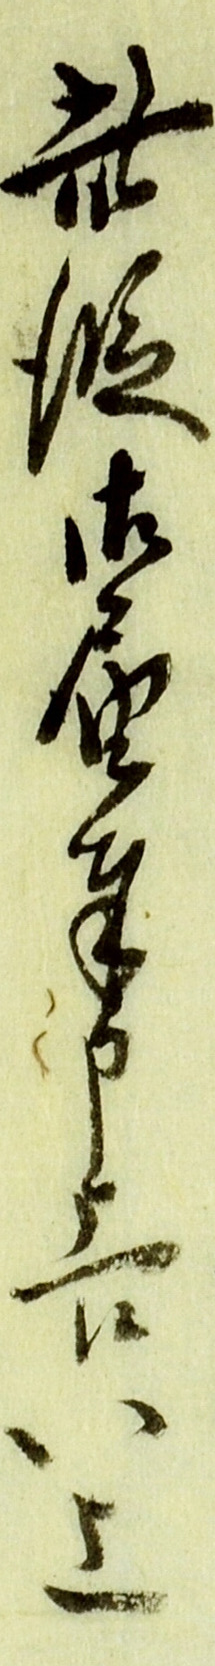此段御届奉申上候以上
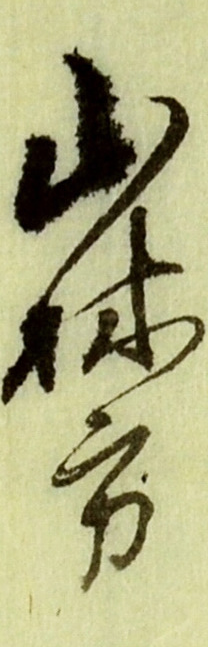山林方
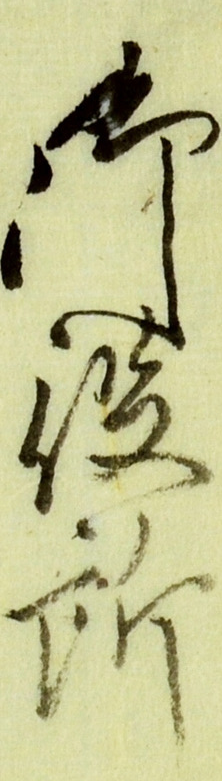御役所

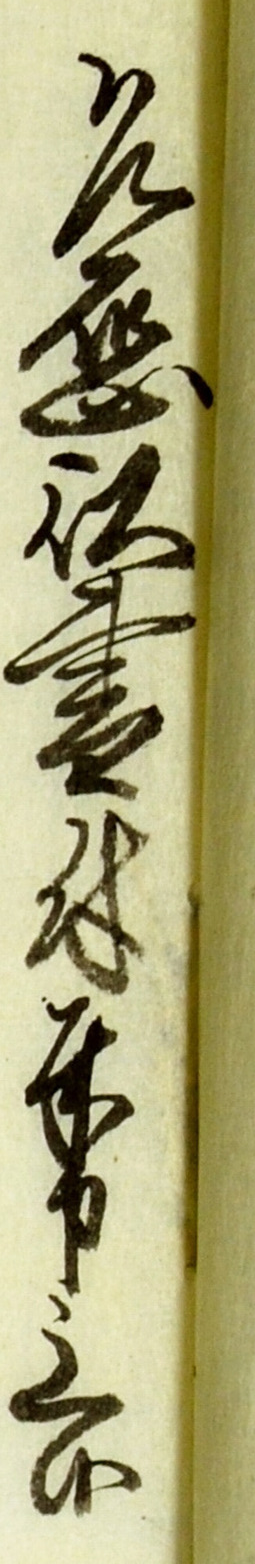乍恐以書付奉申上候
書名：乍恐奉書上候
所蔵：伊那市立高遠町図書館・合同会社AMANE
